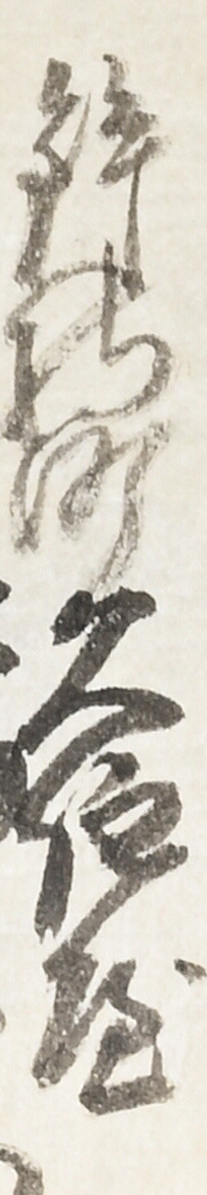鉾持町久住屋
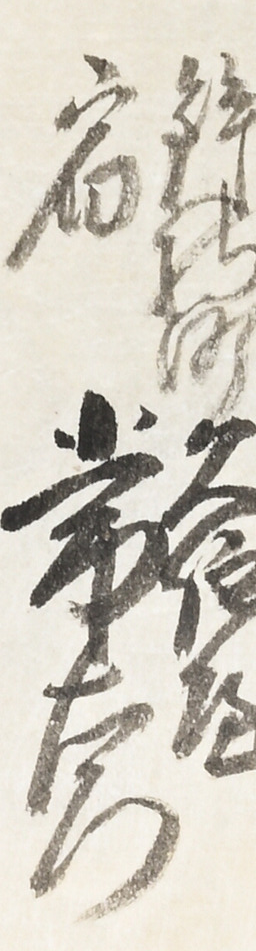宿常右衛門
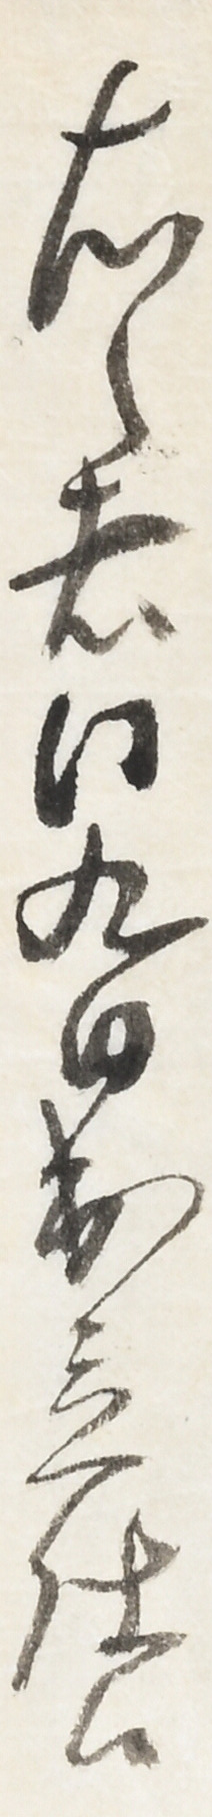右之者同九日出立仕候
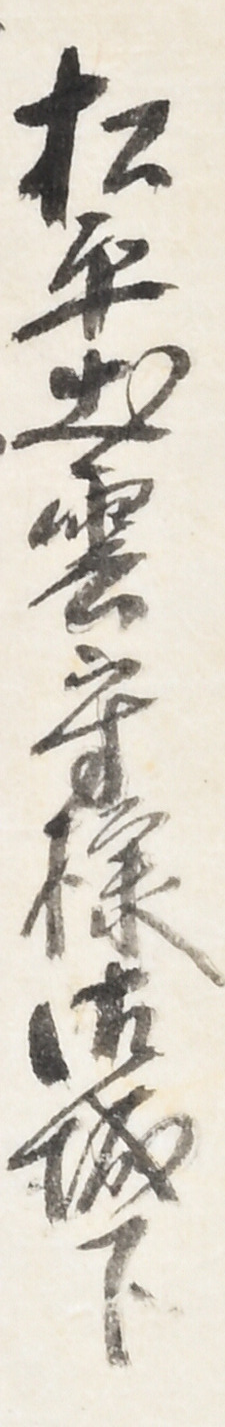松平出雲守様御城下
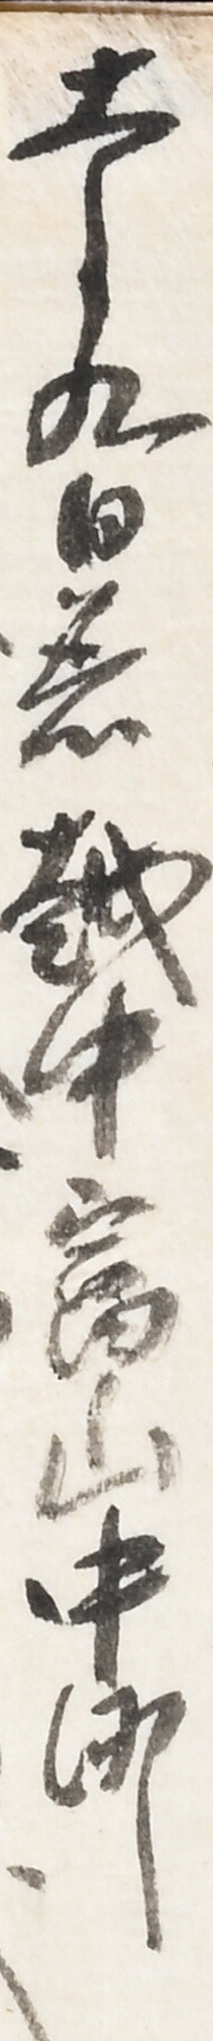十一月九日着越中富山中町
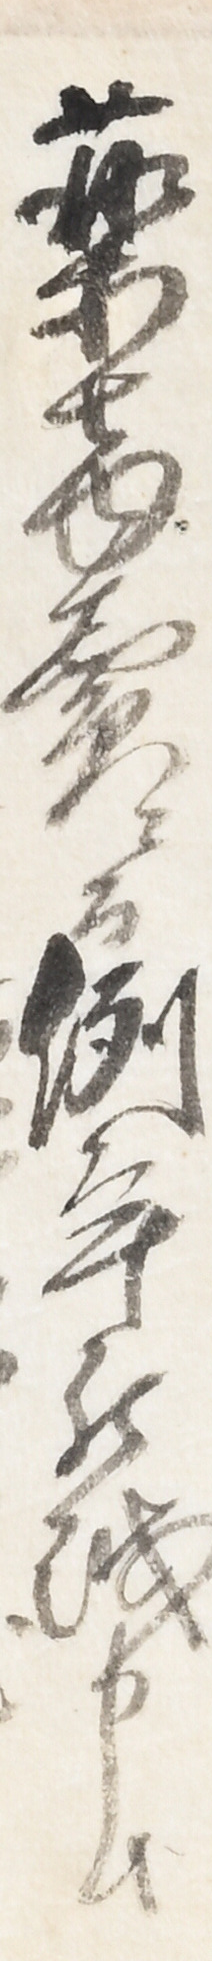薬商売ニ而例年罷越申候
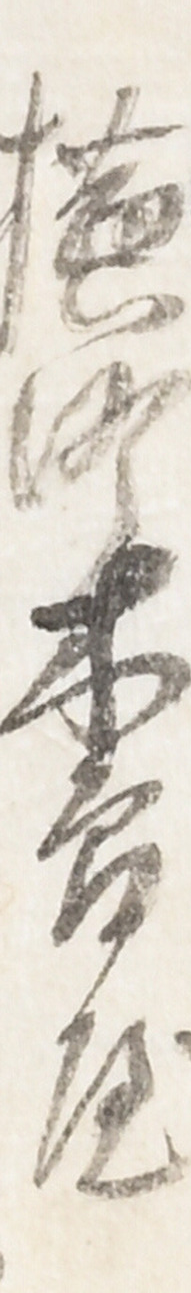横町木曽屋
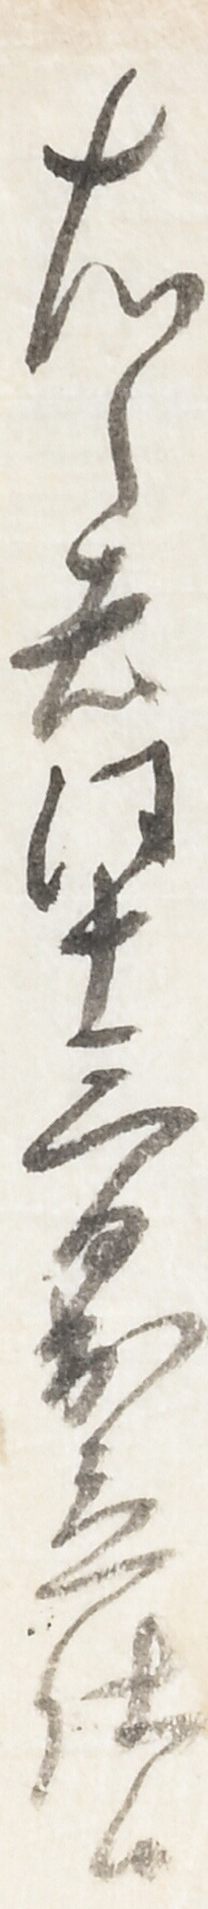右之者同十三日出立仕候
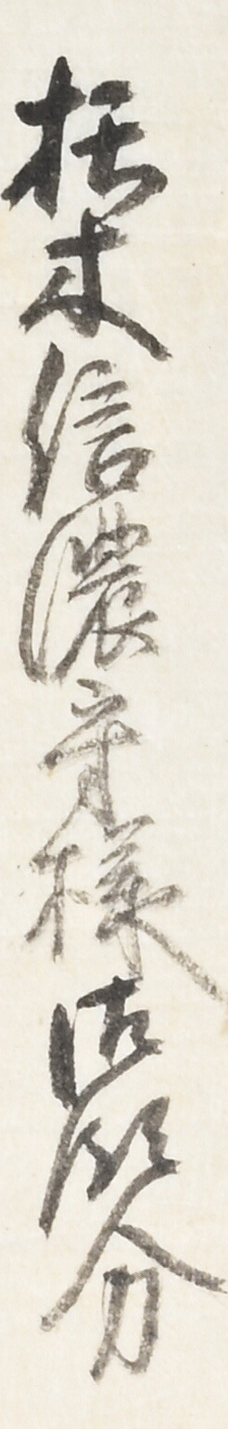朽木信濃守様御領分
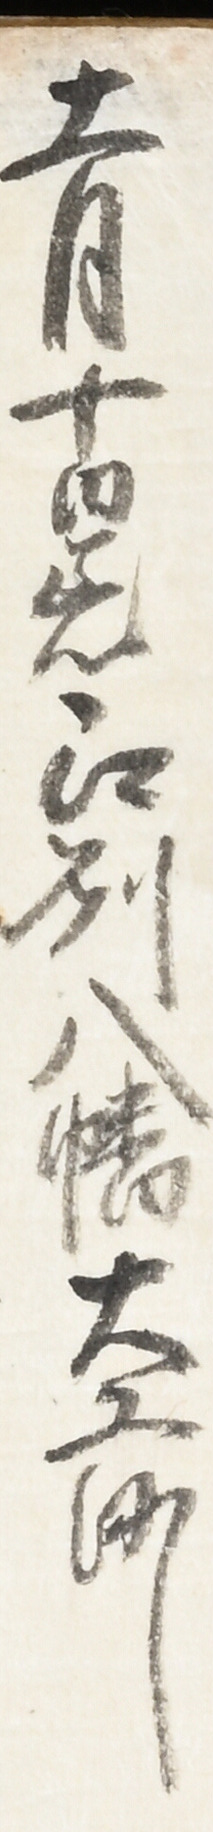十一月十四日着江州八幡大工町
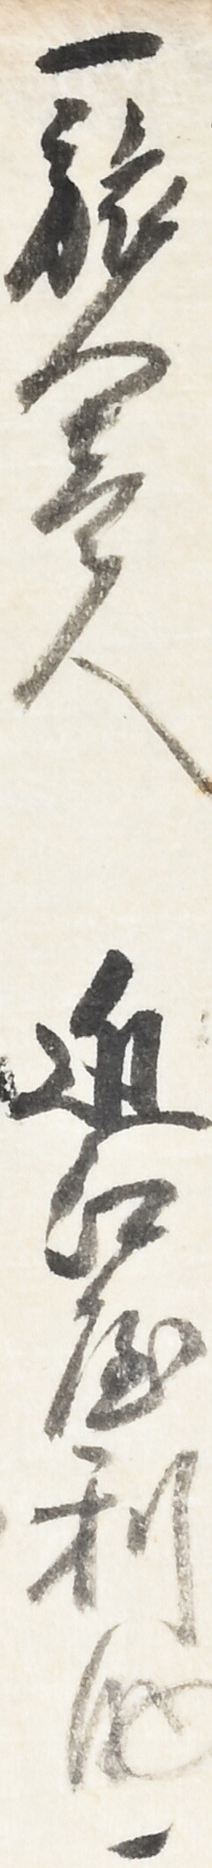一旅人壱人近江屋利助・
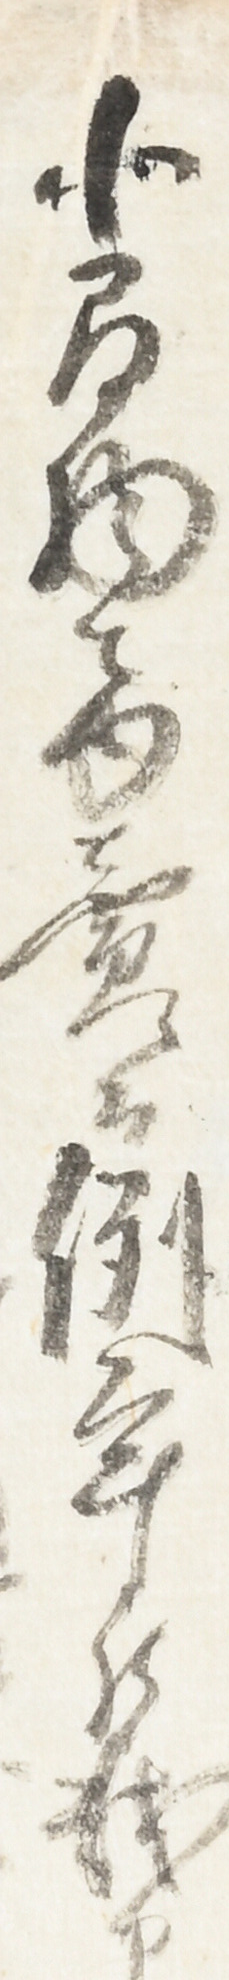小間物商売ニ而例年罷越申候
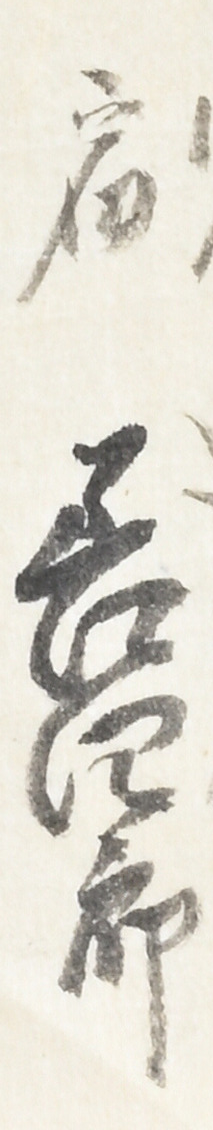宿善四郎
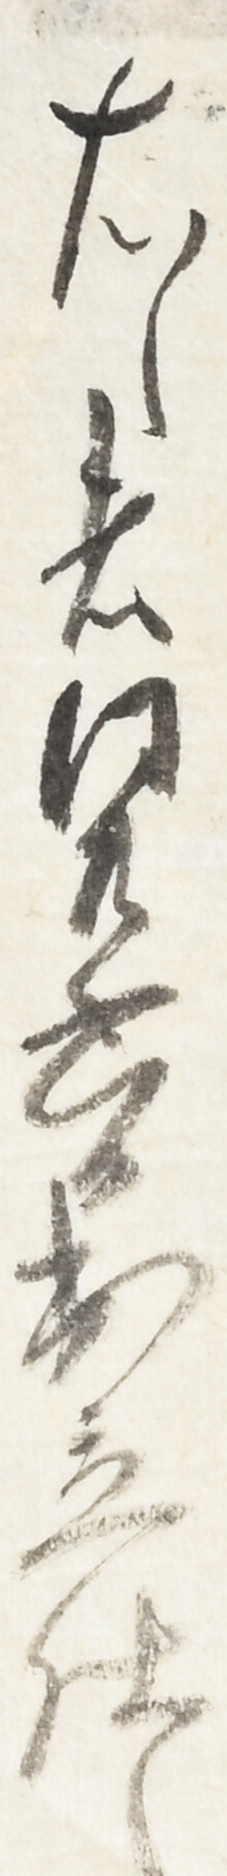右之者同廿六日出立仕候

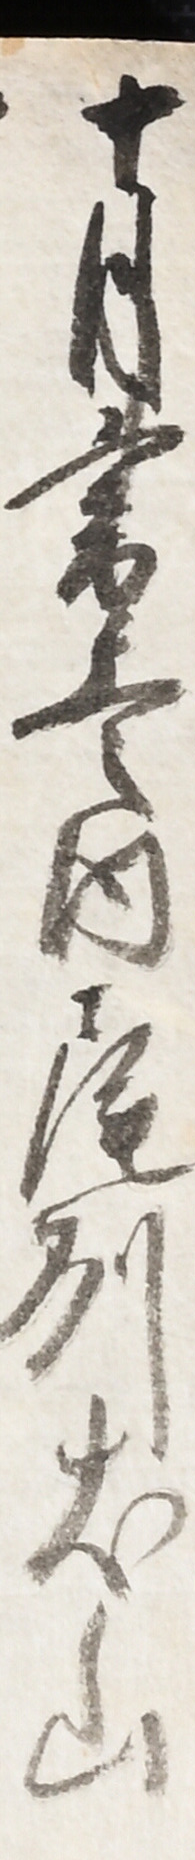十月書上之内尾州犬山
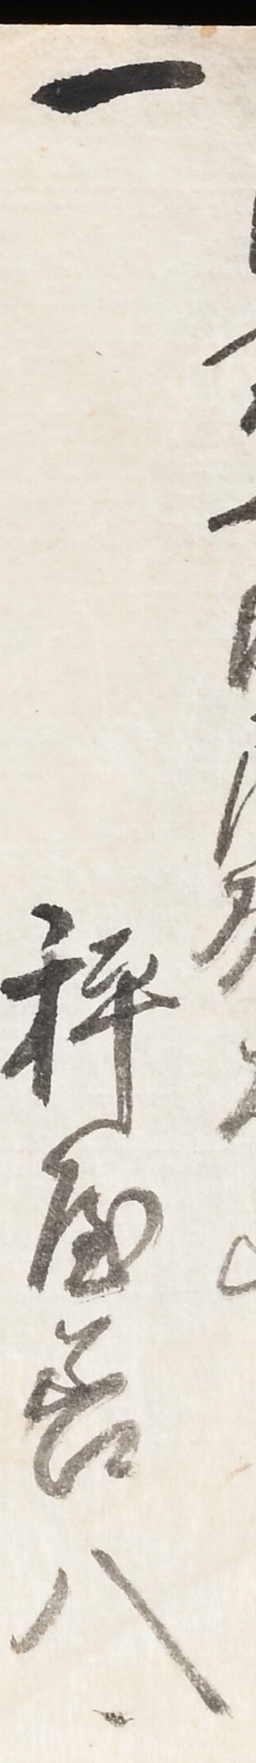一秤屋善八・
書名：旅人泊控帳
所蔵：伊那市立高遠町図書館・合同会社AMANE
